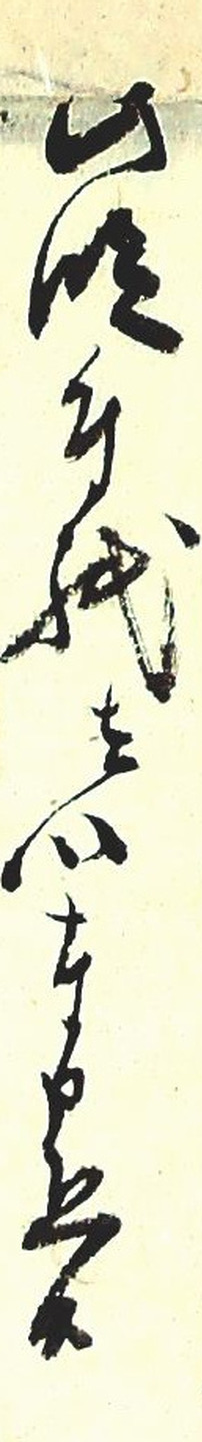此段付紙を以奉申上候

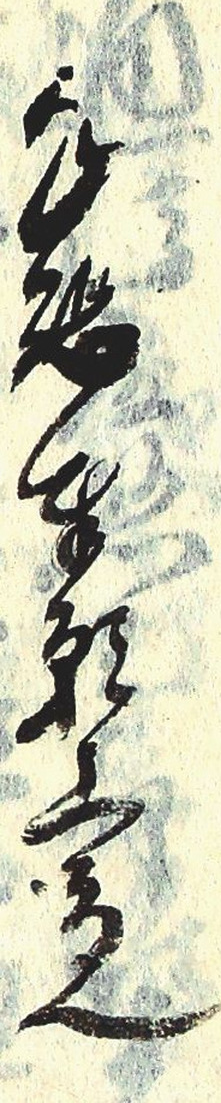乍恐奉願上覚
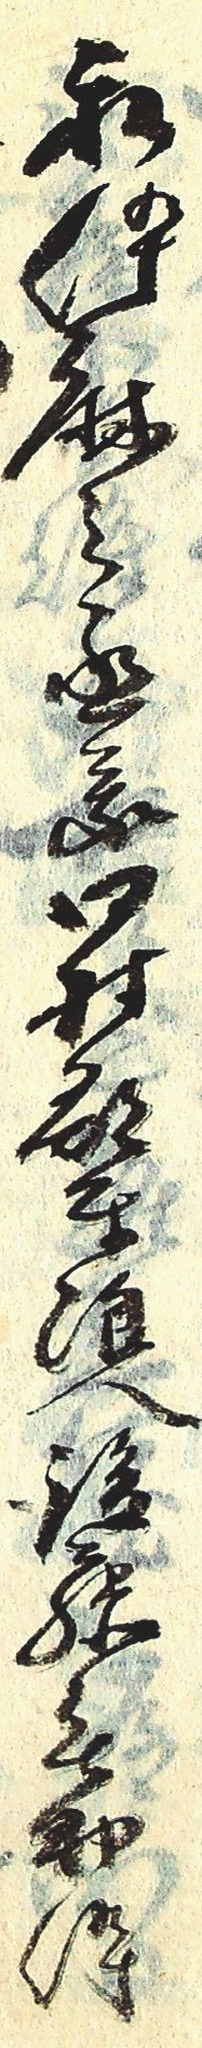私倅麻之丞義同村郡付浪人後藤庄助倅
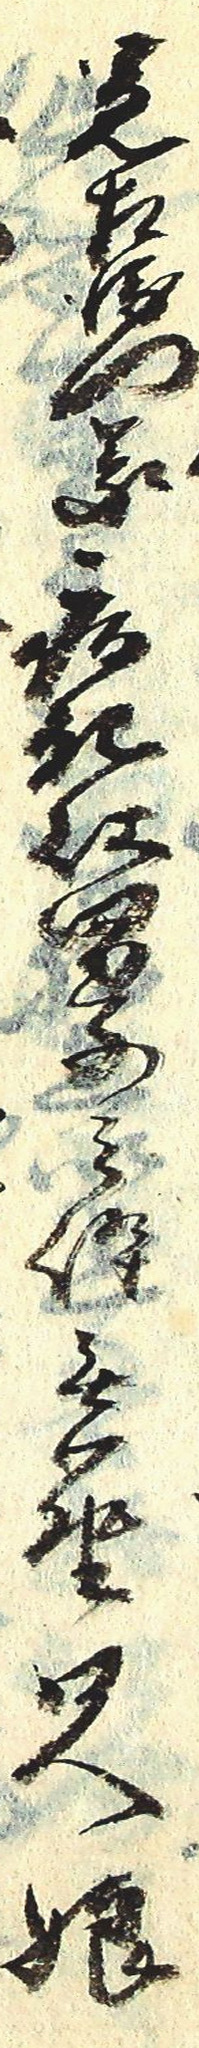覚左衛門義病死仕男子之倅無御座同人娘
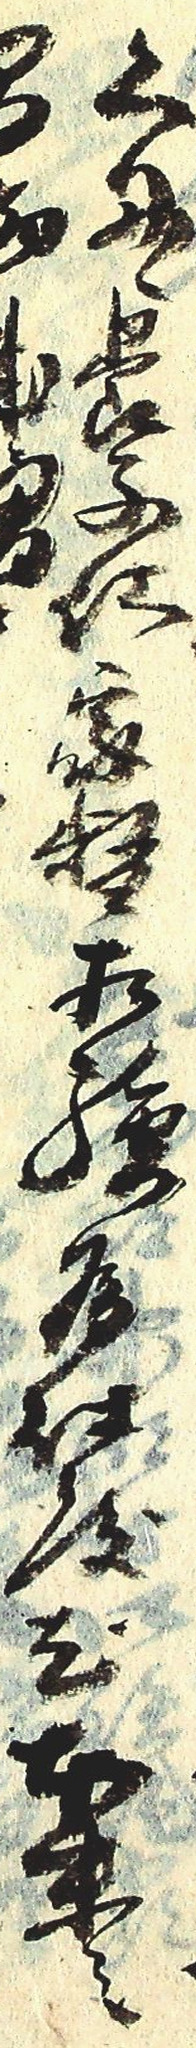くにへ養子仕家督相続為仕度尤本末之
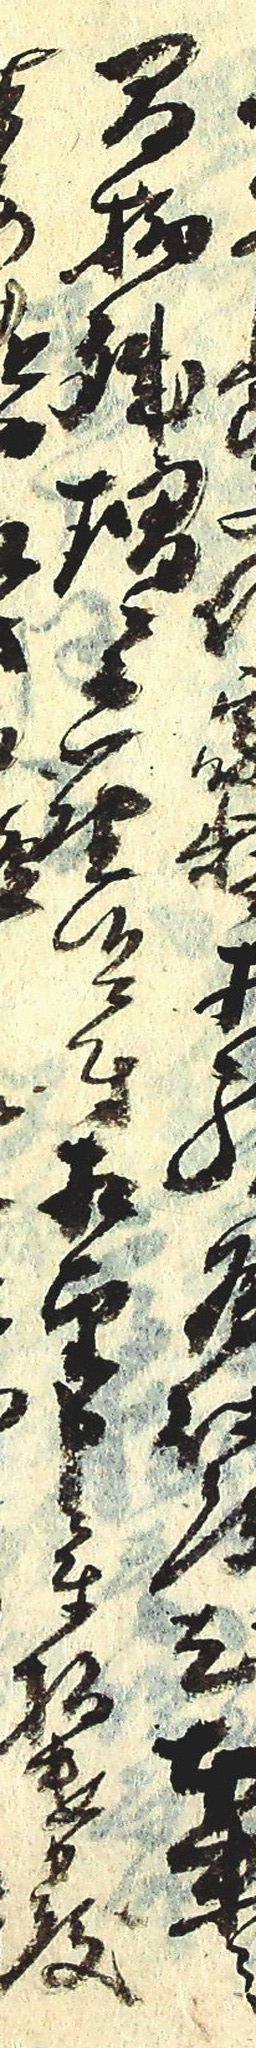間柄殊甥にて御座候に付相望申に付指遣申度
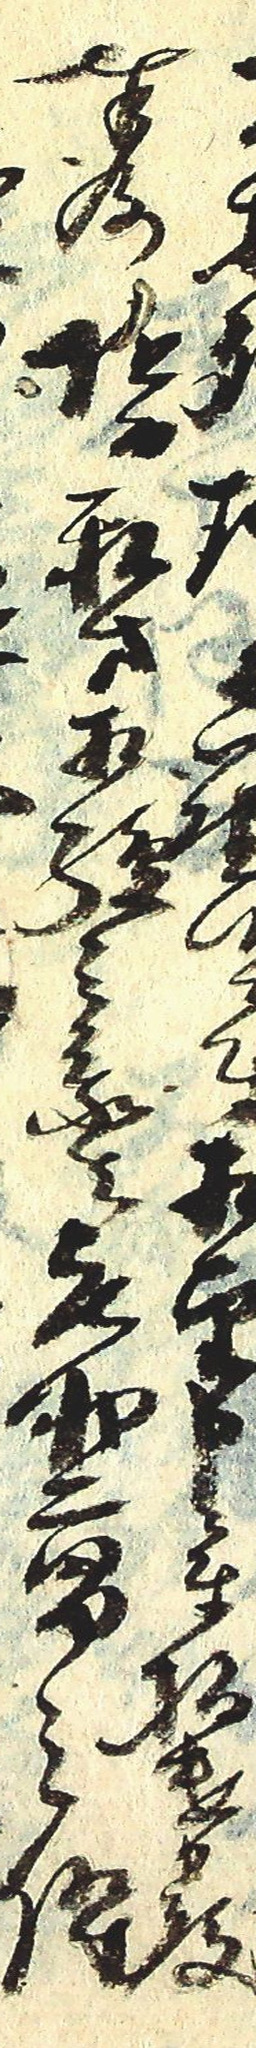奉存随て私方相続之義は庄助二男之倅
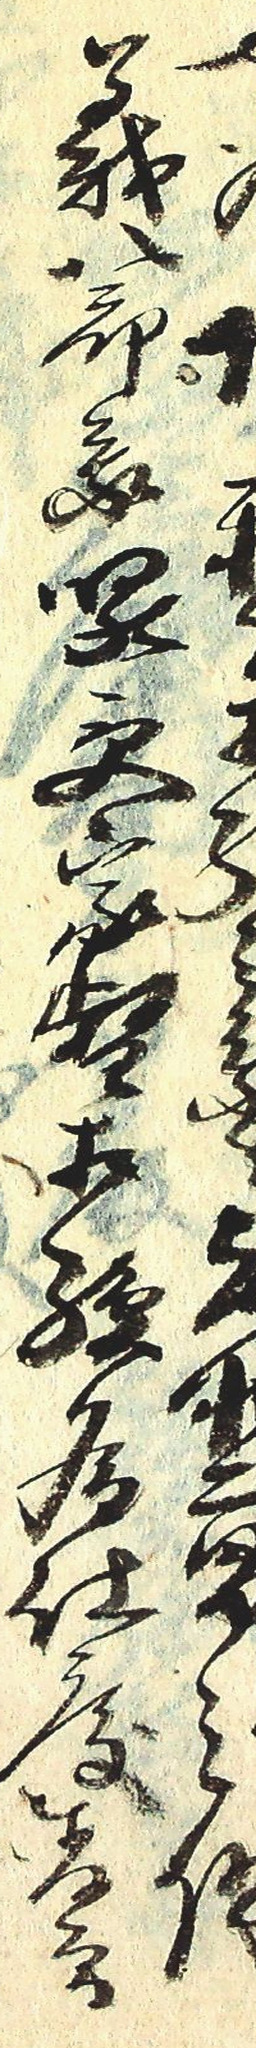義八郎義囉請家督相続為仕度奉存候間
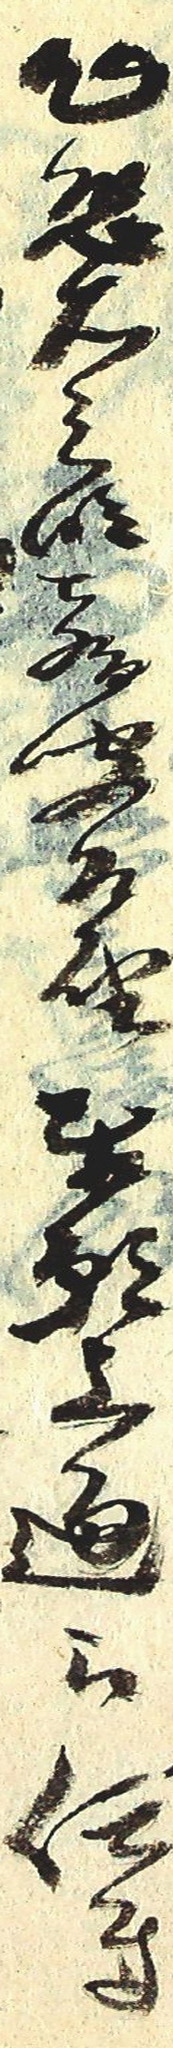乍恐右之段被為聞召届奉願上通被仰付
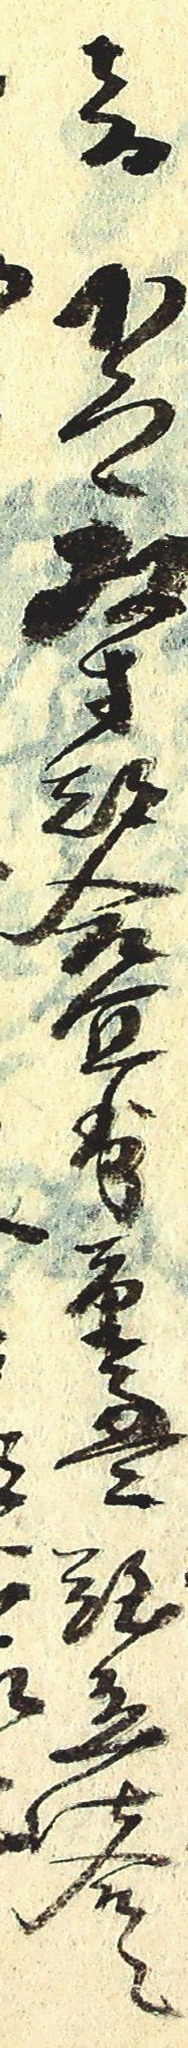被為下候はゝ双方都合宜布重畳難有仕合に
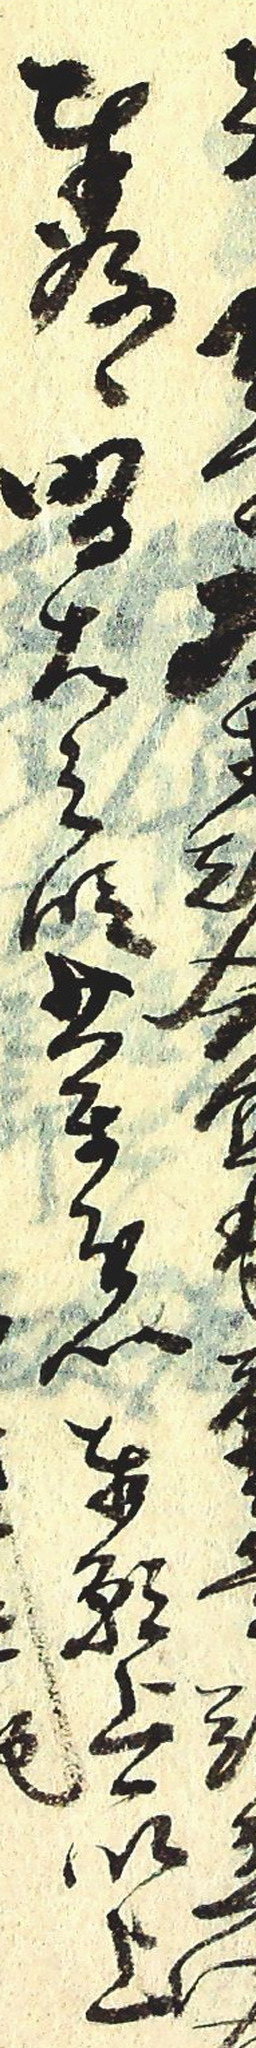奉存候仍て右之段書付を以奉願上候以上
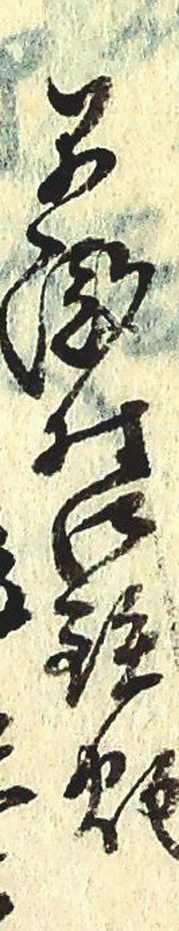早淵村郷鉄炮
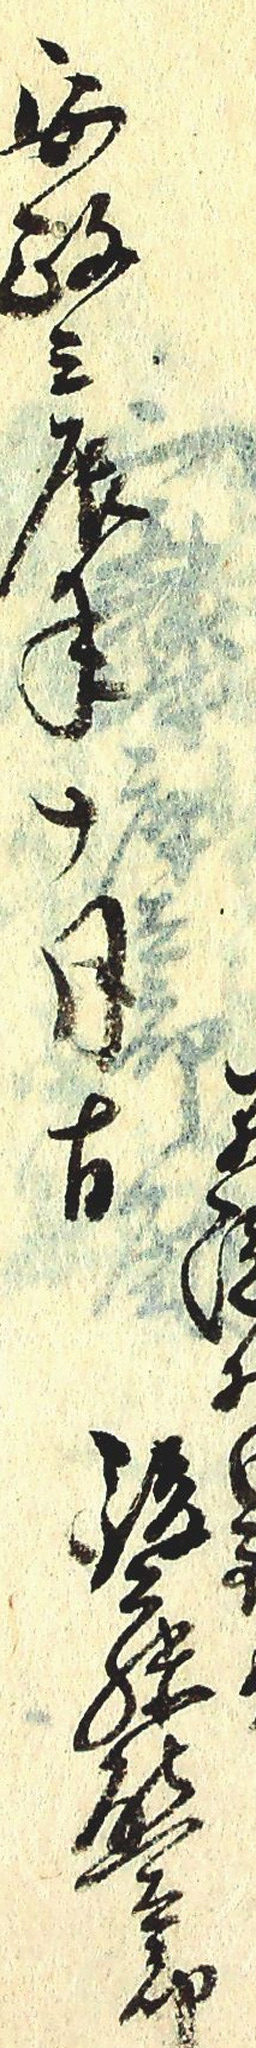安政三辰年十月十日後藤熊太郎
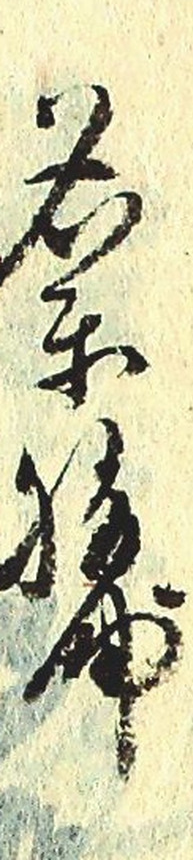名東勝浦
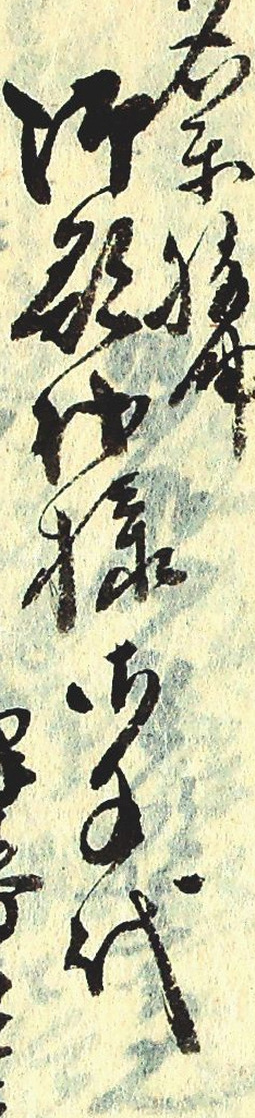御郡代様御手代
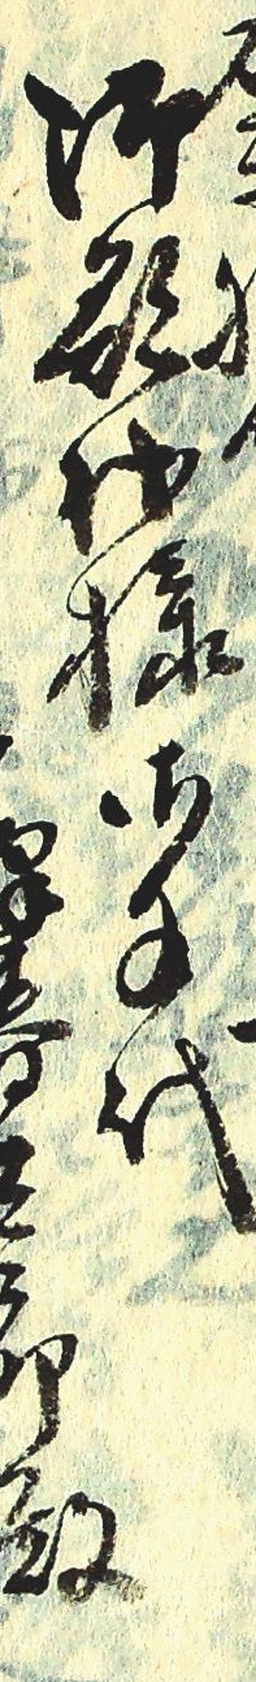御郡代様御手代
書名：諸御願書控(弐番）
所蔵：鳴門教育大学 Naruto University of Education
